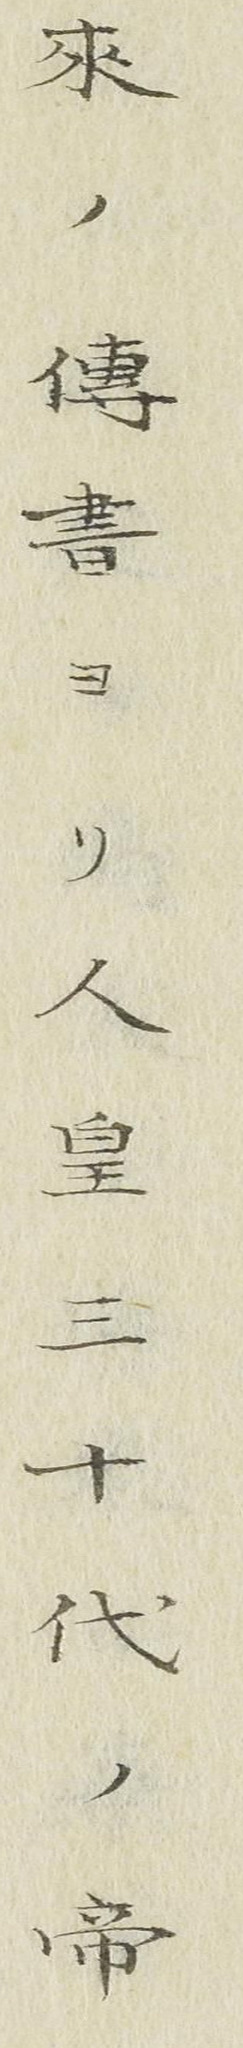来ノ伝書ヨリ人皇三十代ノ帝
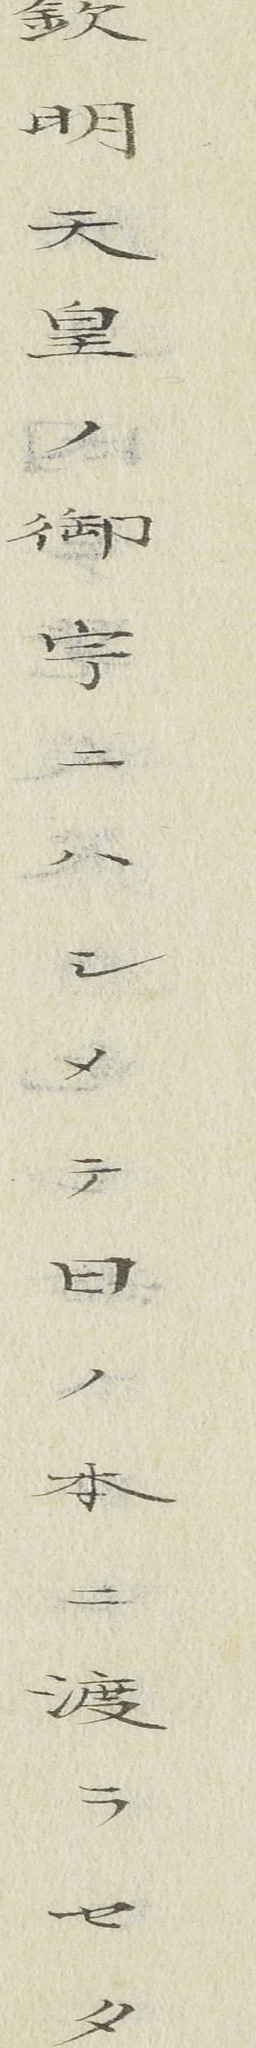欽明天皇ノ御宇ニハシメテ日ノ本ニ渡ラセタ
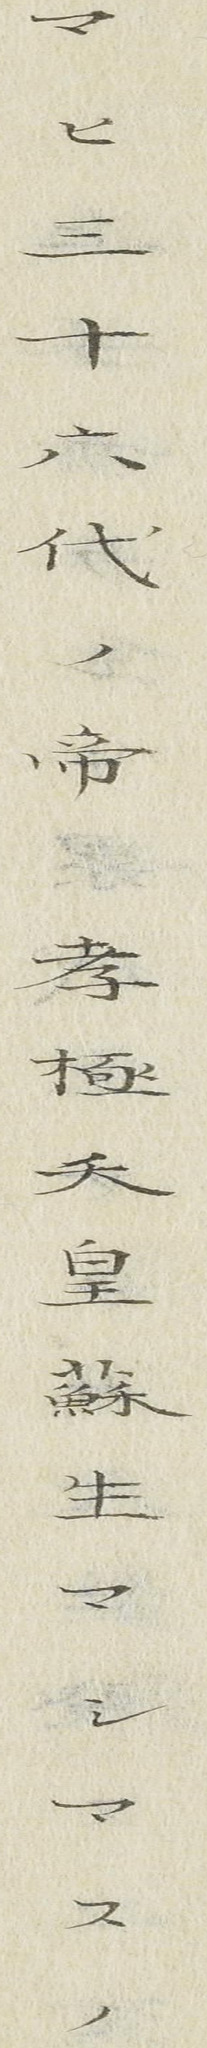マヒ三十六代ノ帝孝極天皇蘇生マシマスノ
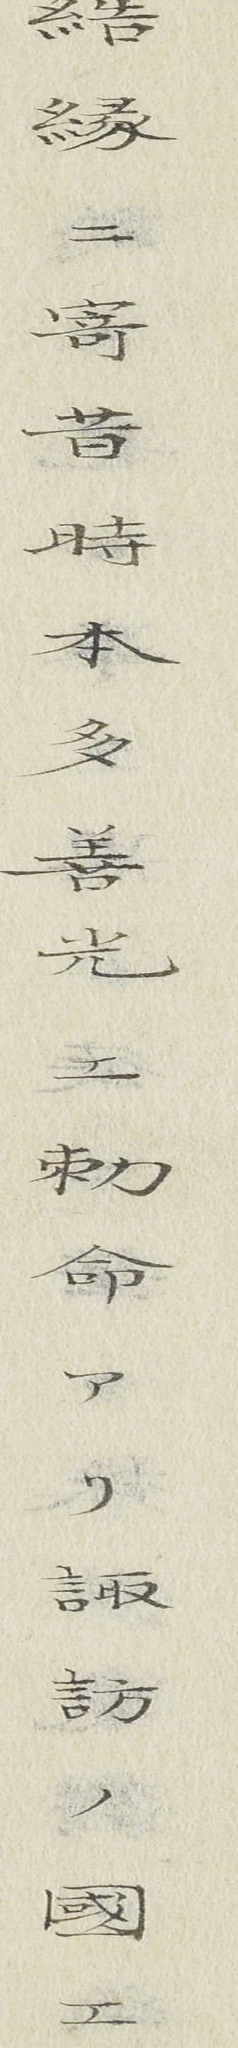結縁ニ寄昔時本多善光ニ勅命アリ諏訪ノ国エ
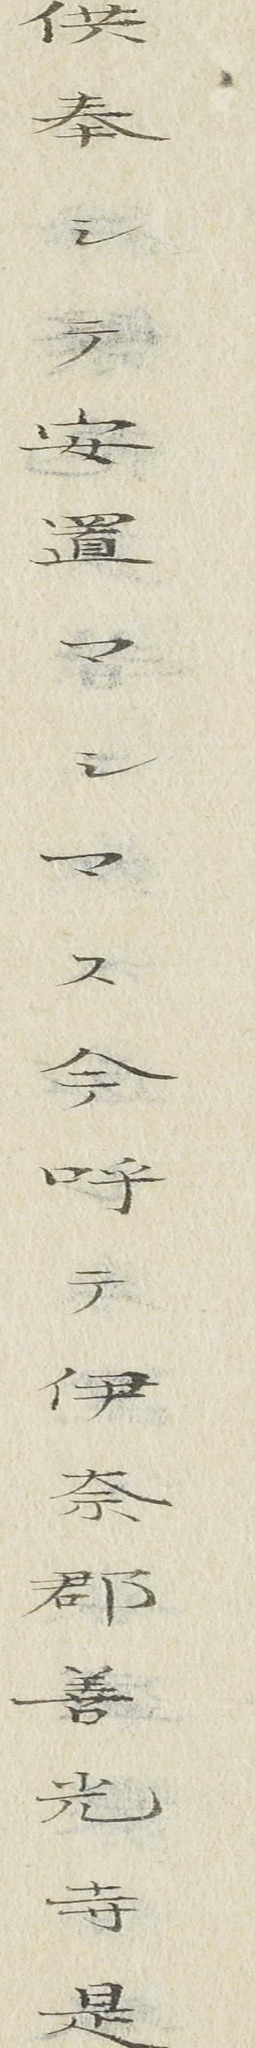供奉シテ安置マシマス今呼テ伊奈郡善光寺是
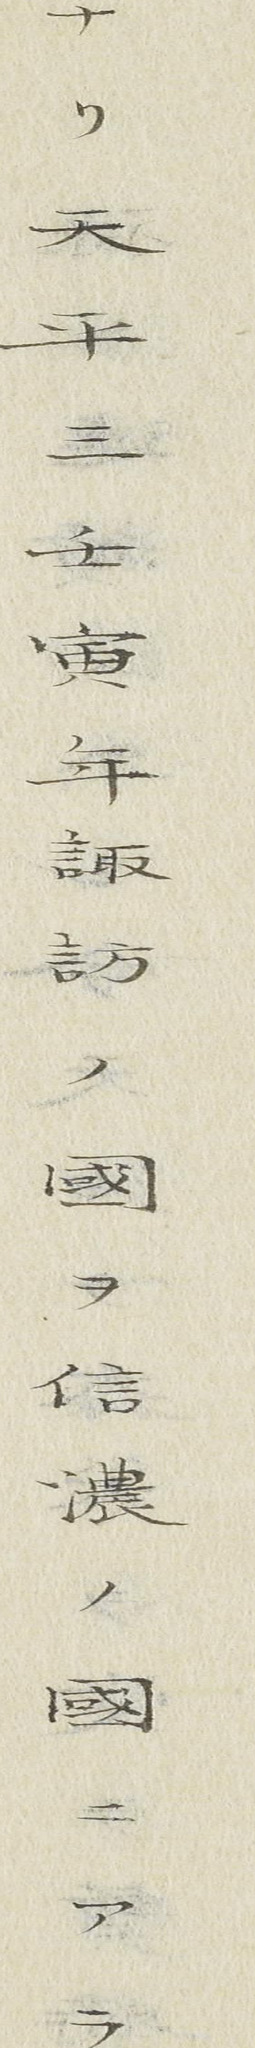ナリ天平三壬寅年諏訪ノ国ヲ信濃ノ国ニアラ
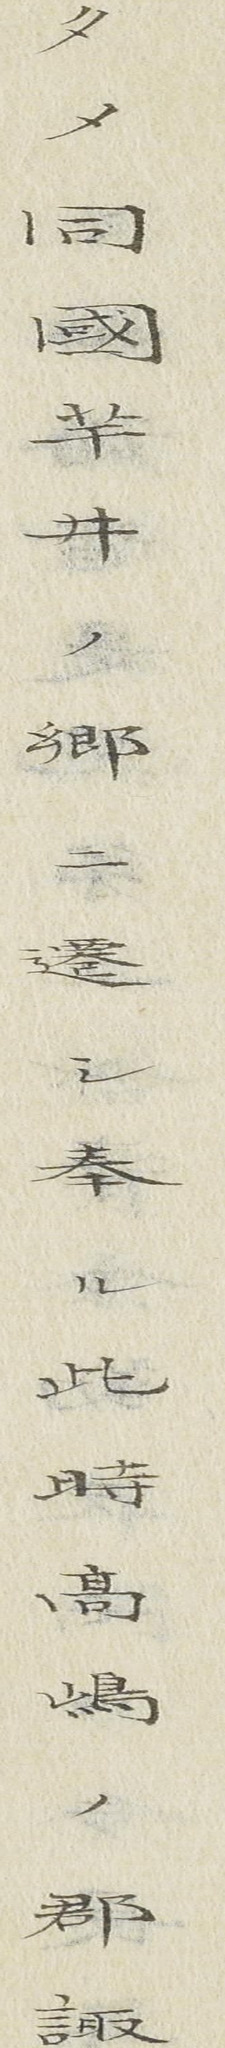タメ同国芋井ノ郷ニ遷シ奉リ此時高嶋ノ郡諏
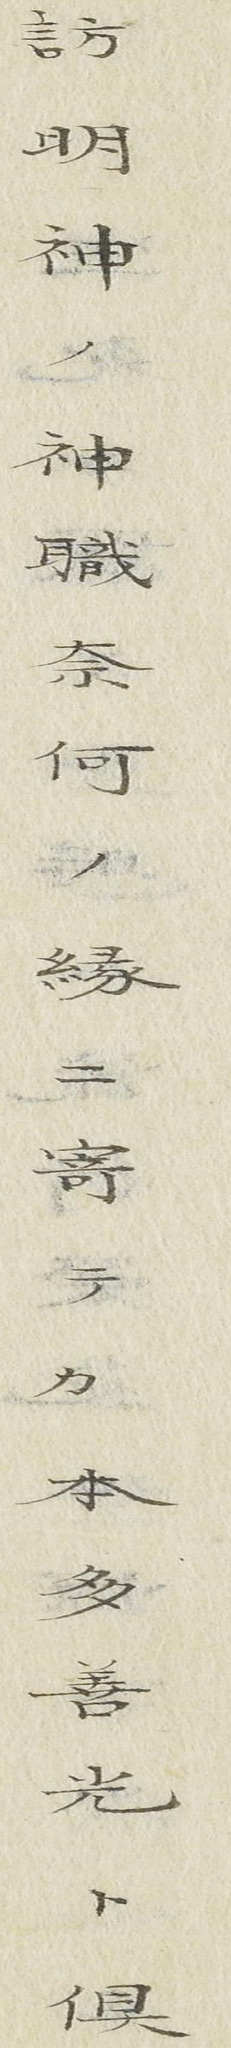訪明神ノ神職奈何ノ縁ニ寄テカ本多善光ト俱
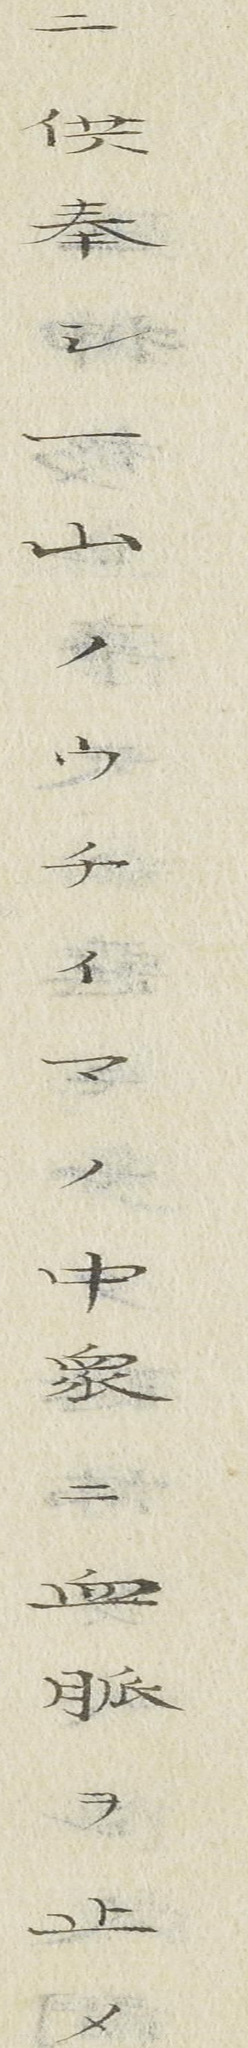ニ供奉シ一山ノウチイマノ中衆ニ血脈ヲ止メ
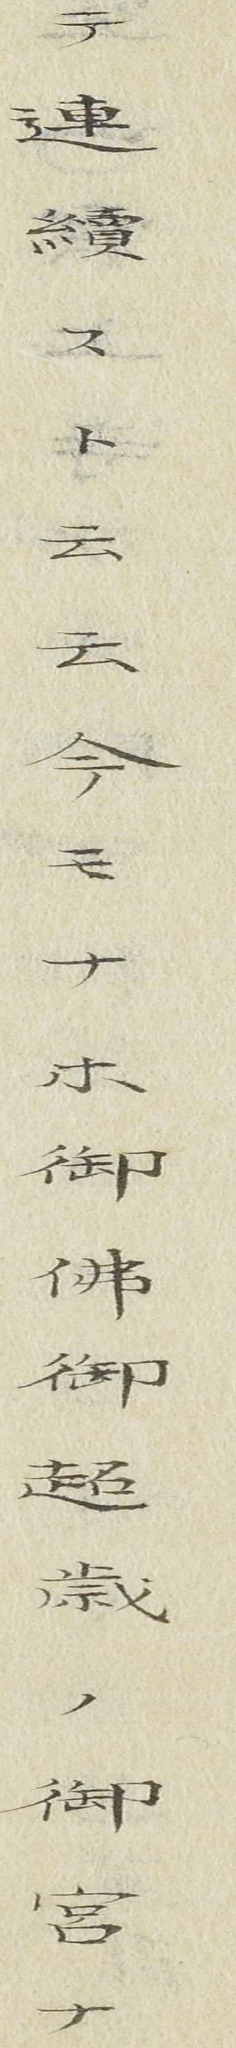テ連続スト云云今モナホ御仏御超歳ノ御宮ナ
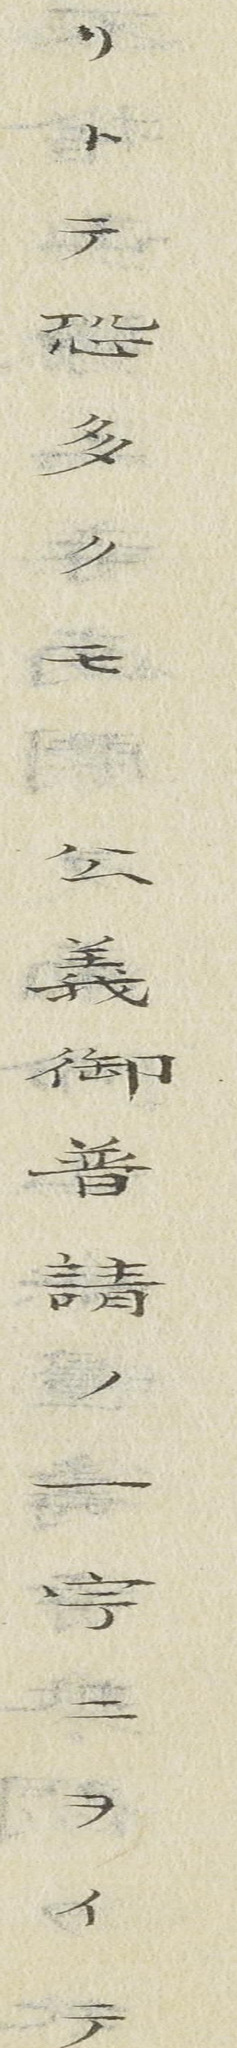リトテ恐多クモ公儀御普請ノ一宇ニヲイテ
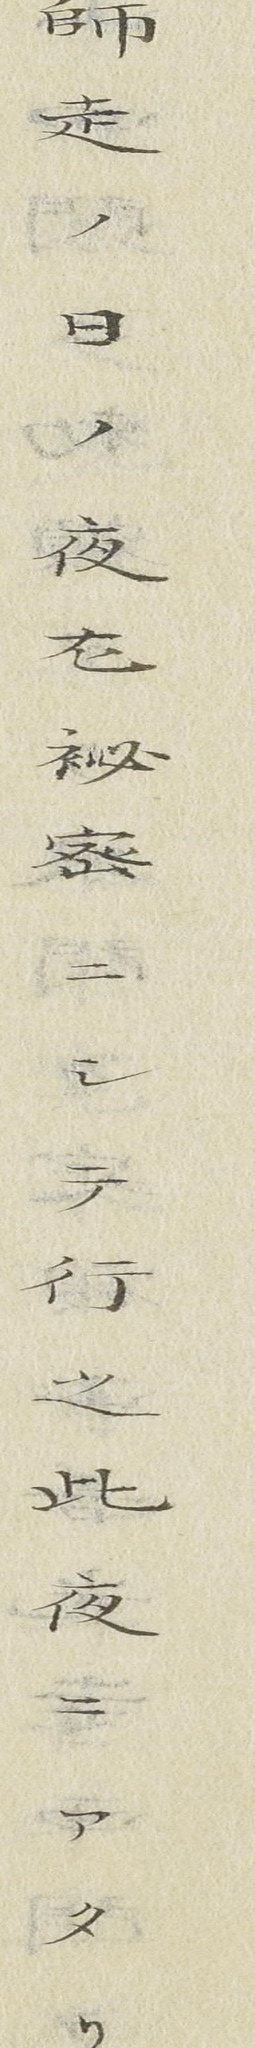師走ノ日ノ夜左秘密ニシテ行之此夜ニアタリ
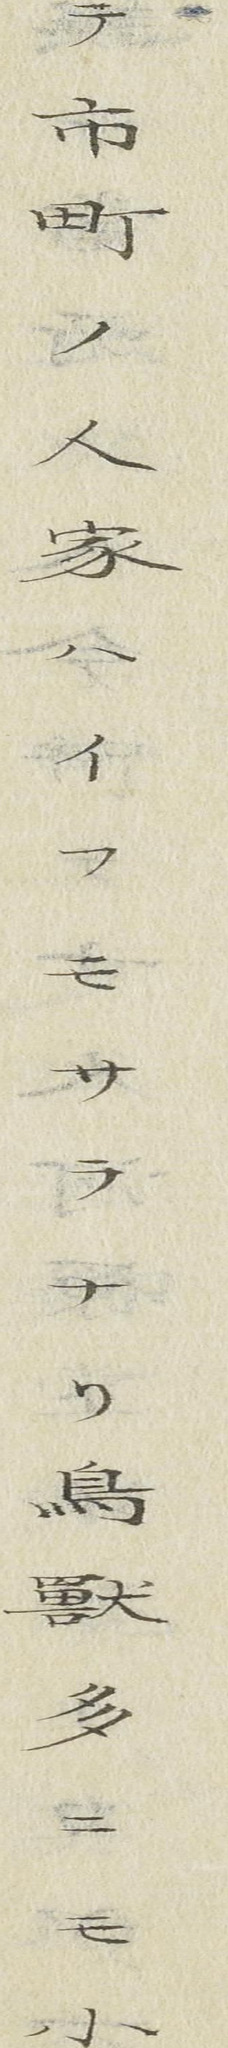テ市町ノ人家ハイフモサラナリ鳥獣多ニモ小
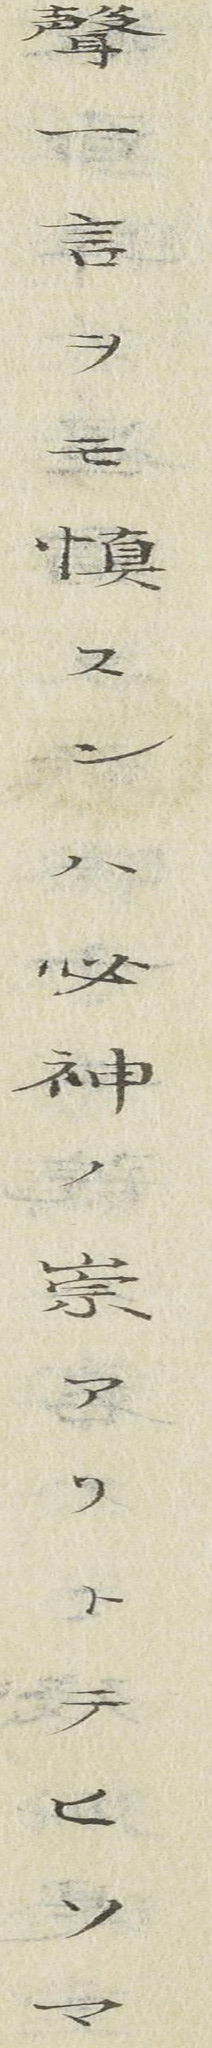声一言ヲモ慎スンハ必神ノ崇アリトテヒソマ
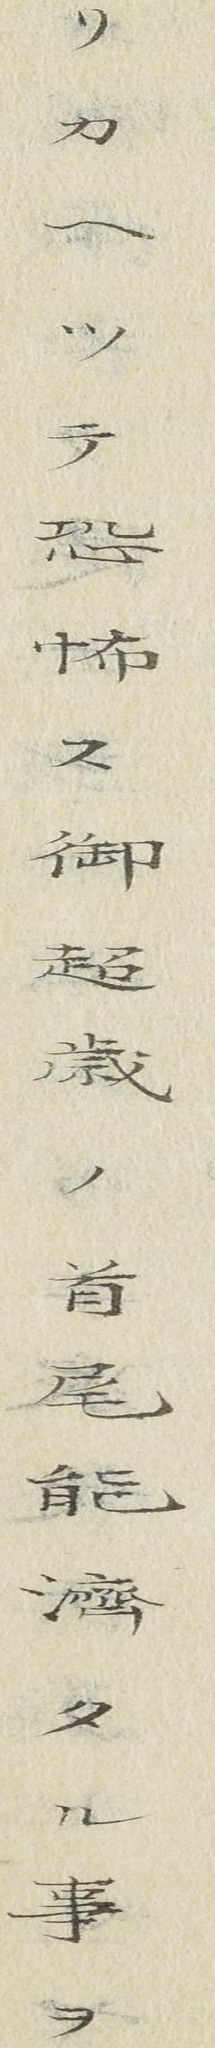リカヘツテ恐怖ス御超歳ノ首尾能湾タル事ヲ
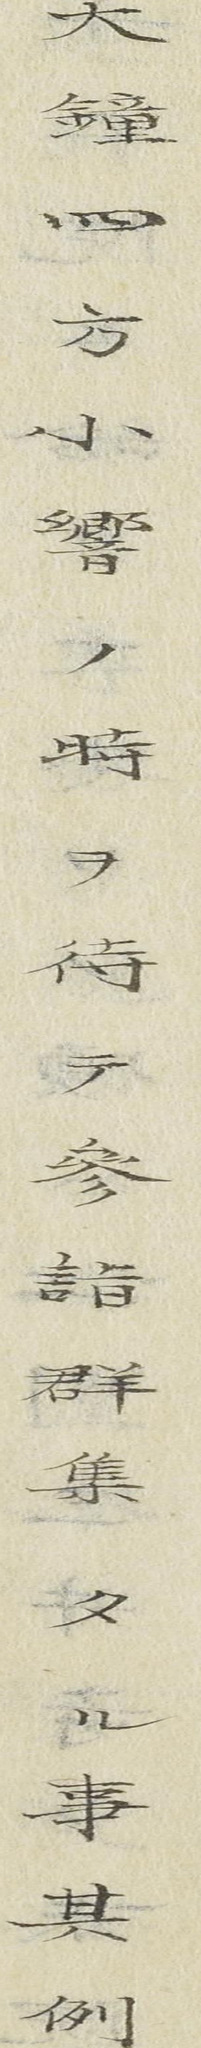大鐘四方小響ノ時ヲ待テ参詣群集タル事其例
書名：地災撮要　地震之部　巻ノ二
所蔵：東京大学地震研究所図書室 Earthquake Research Institute Library, The University of Tokyo, JAPAN
